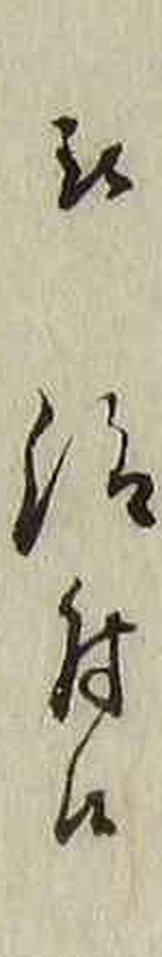被仰付候
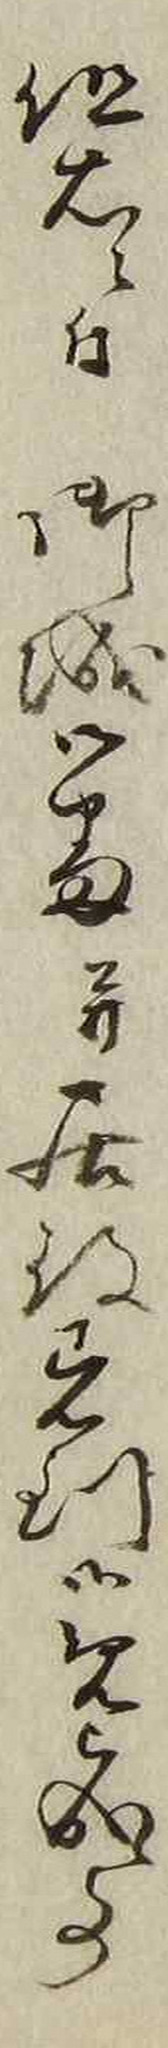但右に付御城御番幷居役差役御免被成候事
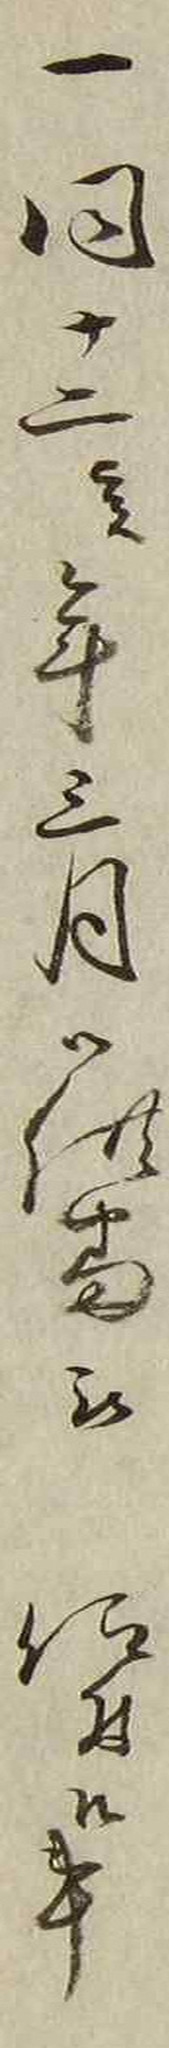一同十二亥年三月御供番被仰付候事
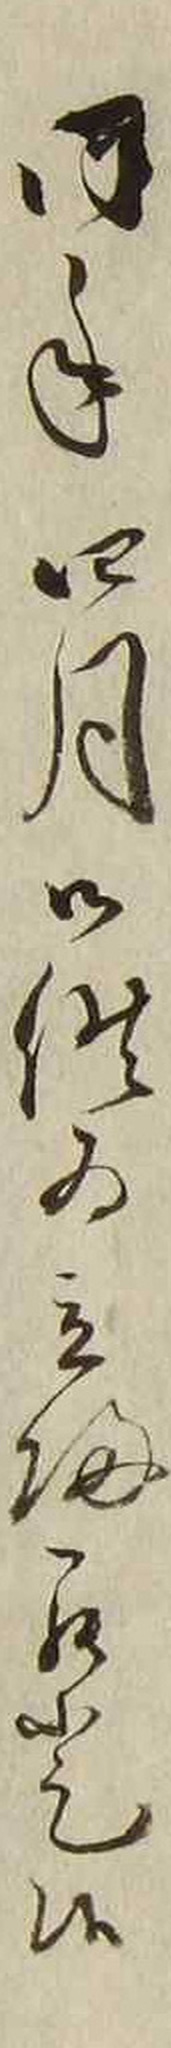同年四月御供為立帰罷登候

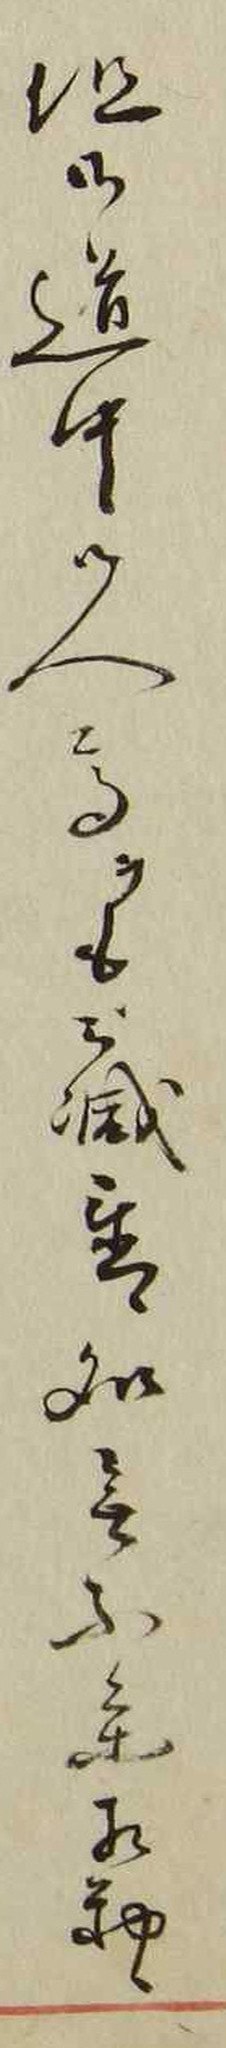但御道中御人馬ヲも被減置候処無不参相勤候
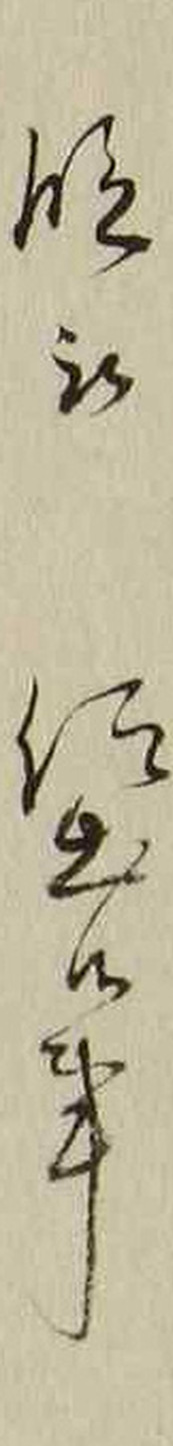段被仰出候事
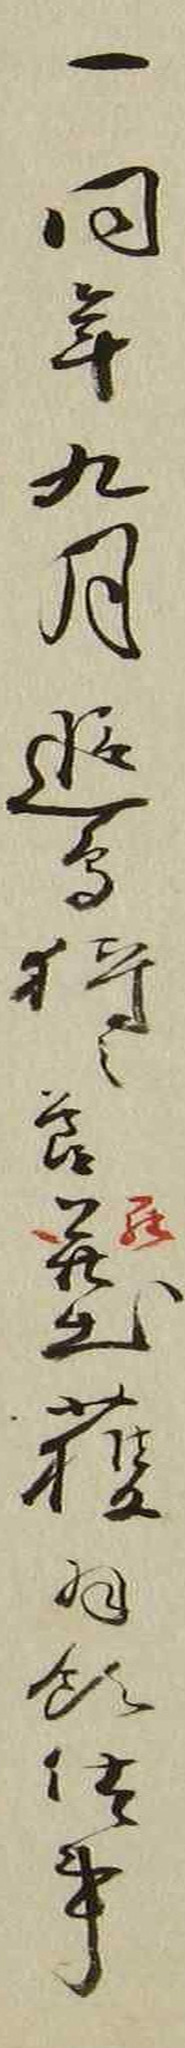一同年九月追鳥狩之節幷居出獲物領仕候事
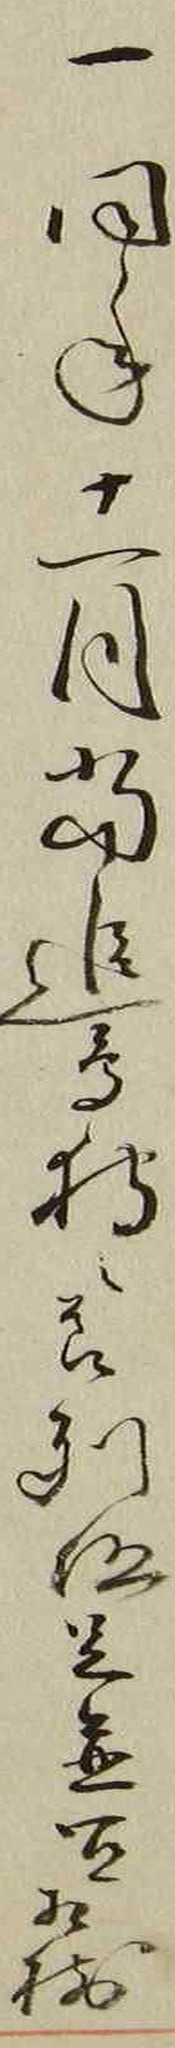一同年十一月当追鳥狩之節列伍足並宜相揃
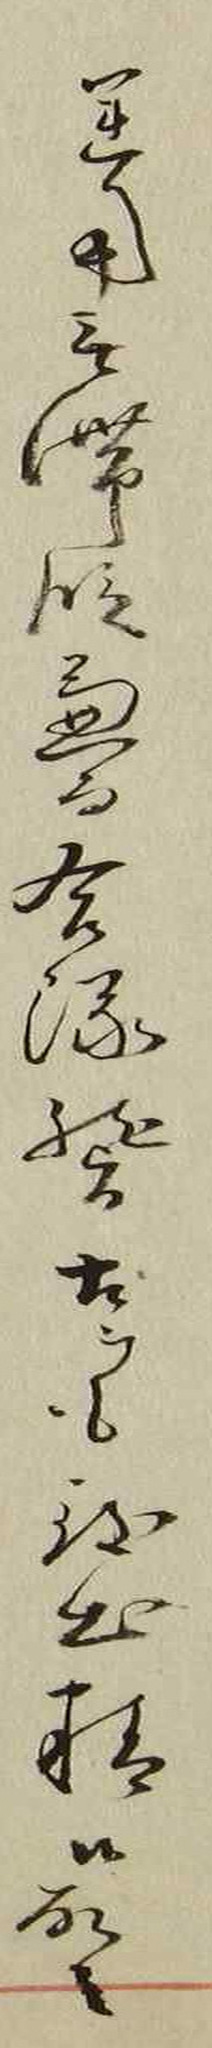運用無滞候段兼而合流稽古ヲも致出精候処之
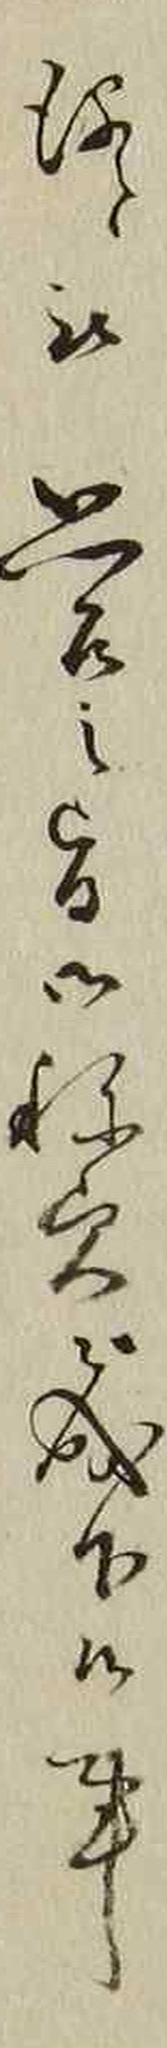儀と被思召之旨御称美被成下候事
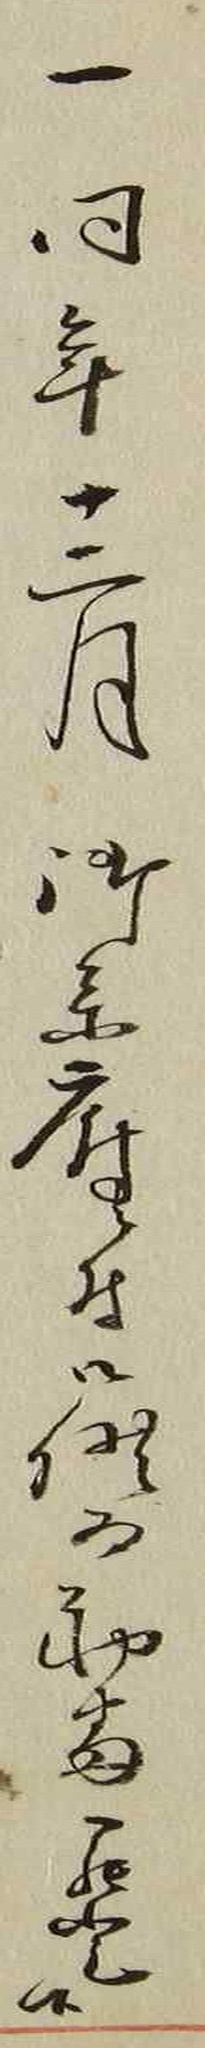一同年十二月御参府に付御供為勤番罷登候
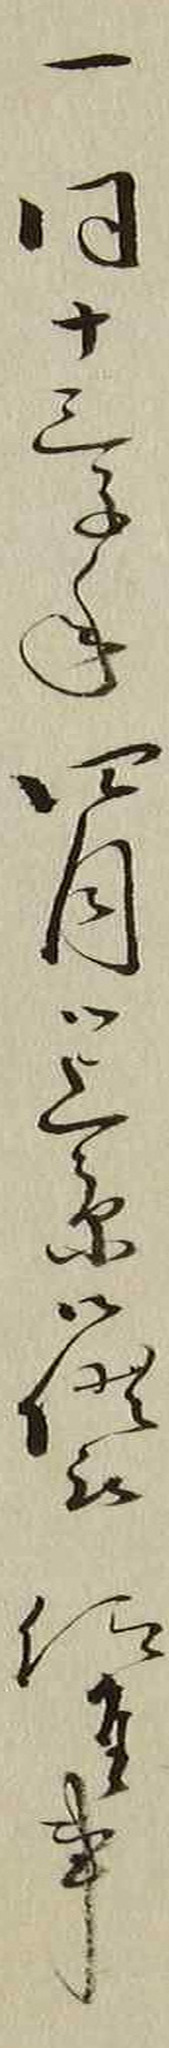一同十三子年四月御上京御供被仰付候事
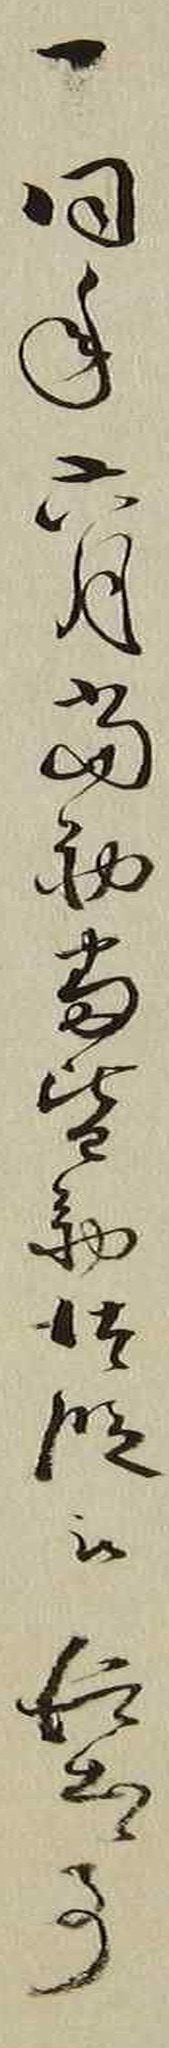一同年六月当勤番皆勤仕候段被仰出候事
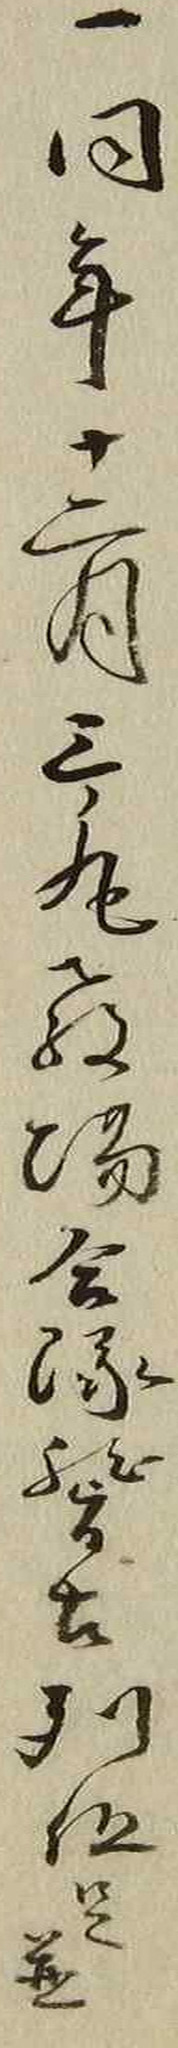一同年十二月三之丸登城合流稽古列伍足並
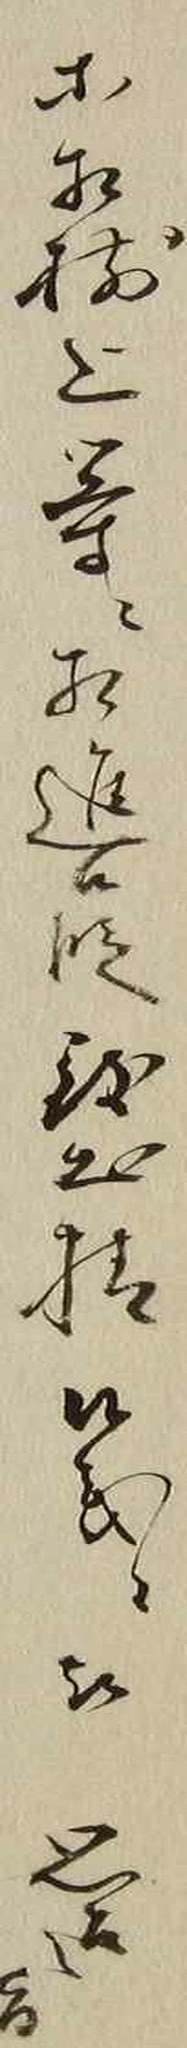等相揃上等に相進候段致出精候義と被思召之旨
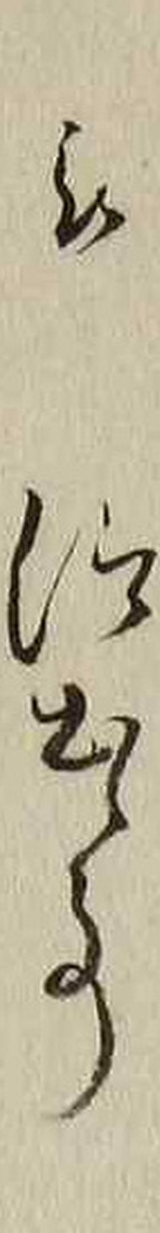被仰出候事
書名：諸士系譜　巻之6　い之部6
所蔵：会津若松市立会津図書館
